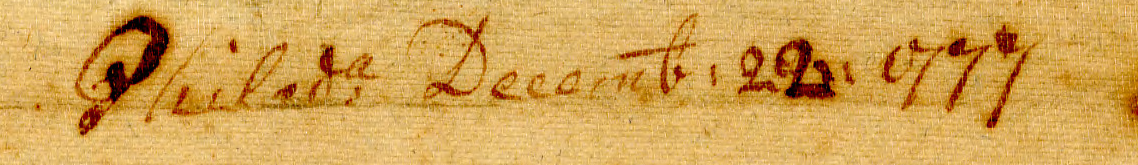Philad^a, Decemb: 22: 1777
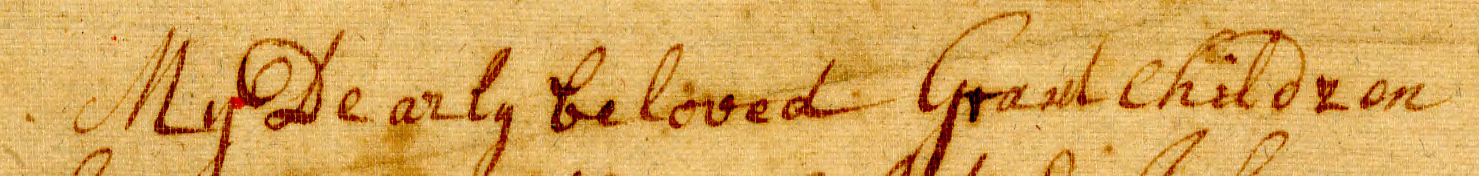My Dearly beloved Grantchildren
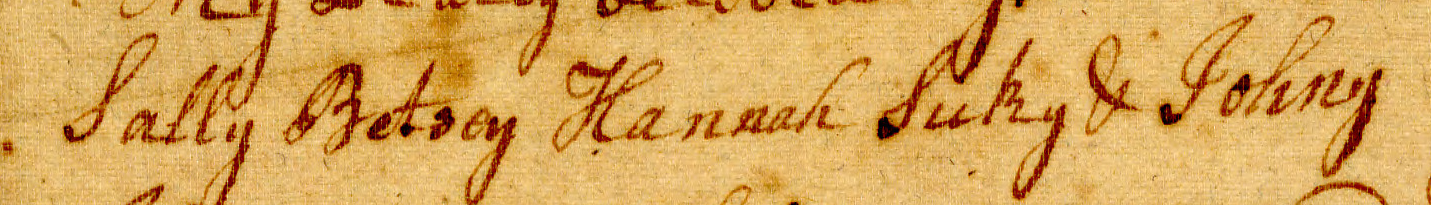Sally Betsey Hannah Suky & Johny
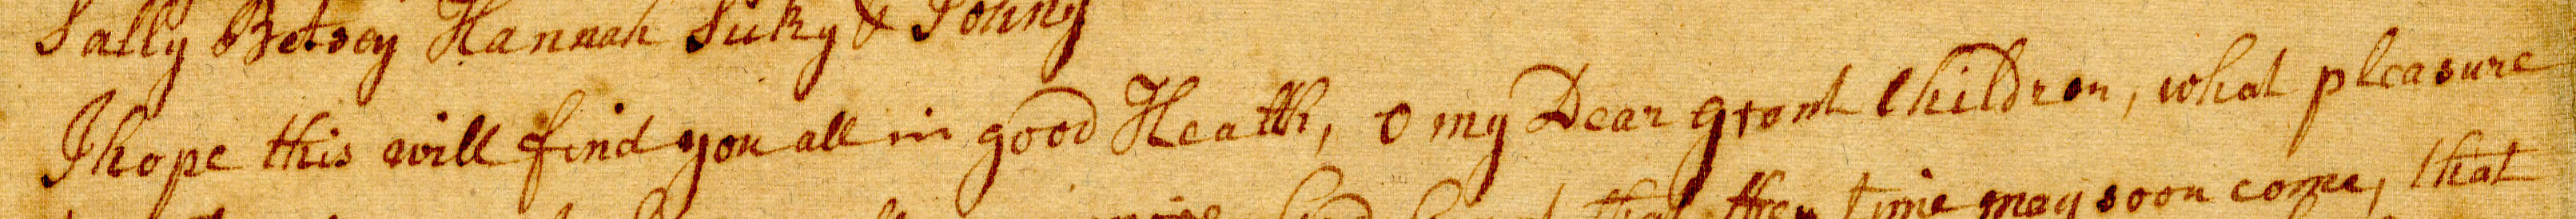I hope this will find you all in good Health, o my Dear grant children, what pleasure
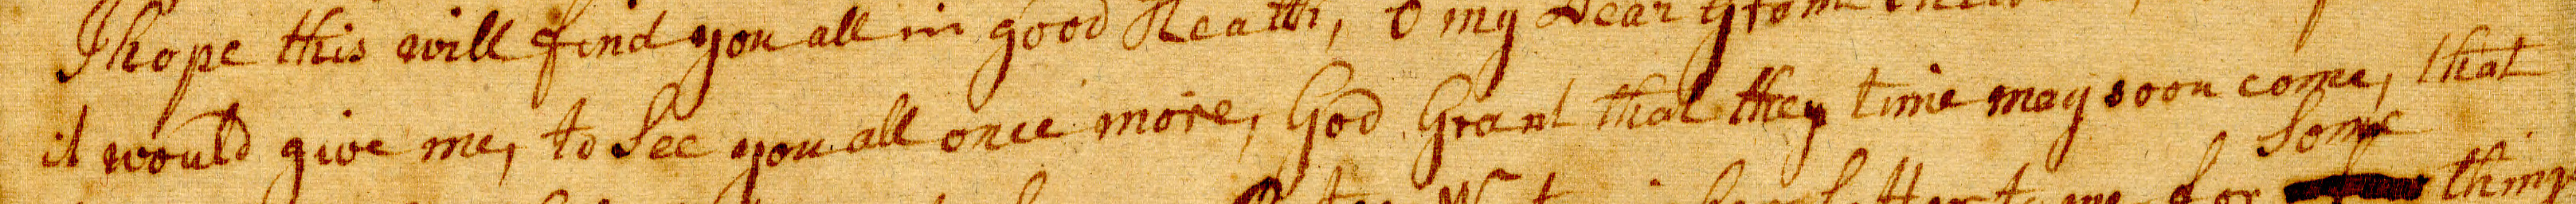it would give me, to See you all once more, God Grant that they time may soon come, that
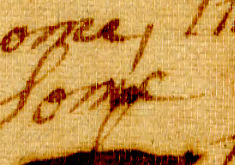some
